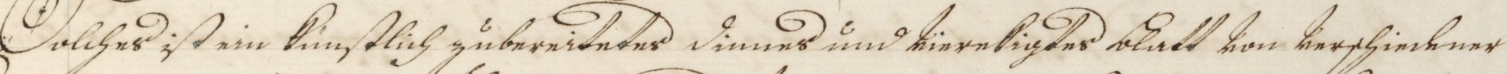Solches ist ein künstlich zubereitetes dinnes und vierekigtes Blatt von verschiedener
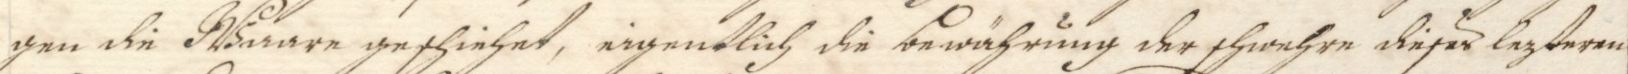gen die Waare geschiehet, eigentlich die Bewährung der schwehre dieses lezteren
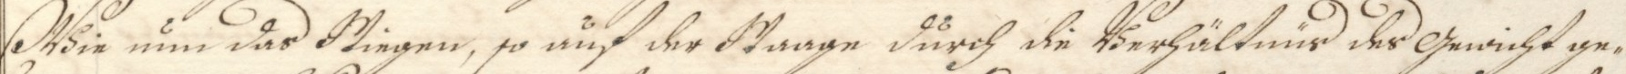Wie nun das Wiegen, so auf der Waage durch die Verhältnüs des Gewicht ge-
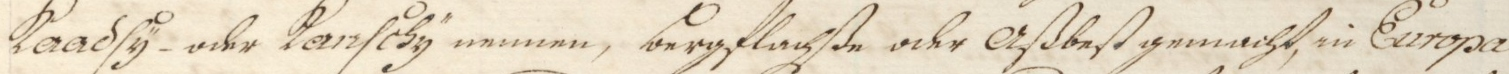Kaadsy- oder Kanschy nennen, Bergflachße oder Aßbest gemacht, in Europa
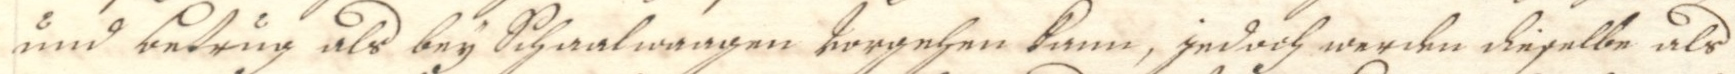und Betrug als bey Schaalwaagen vorgehen kann, jedoch werden dieselbe als
